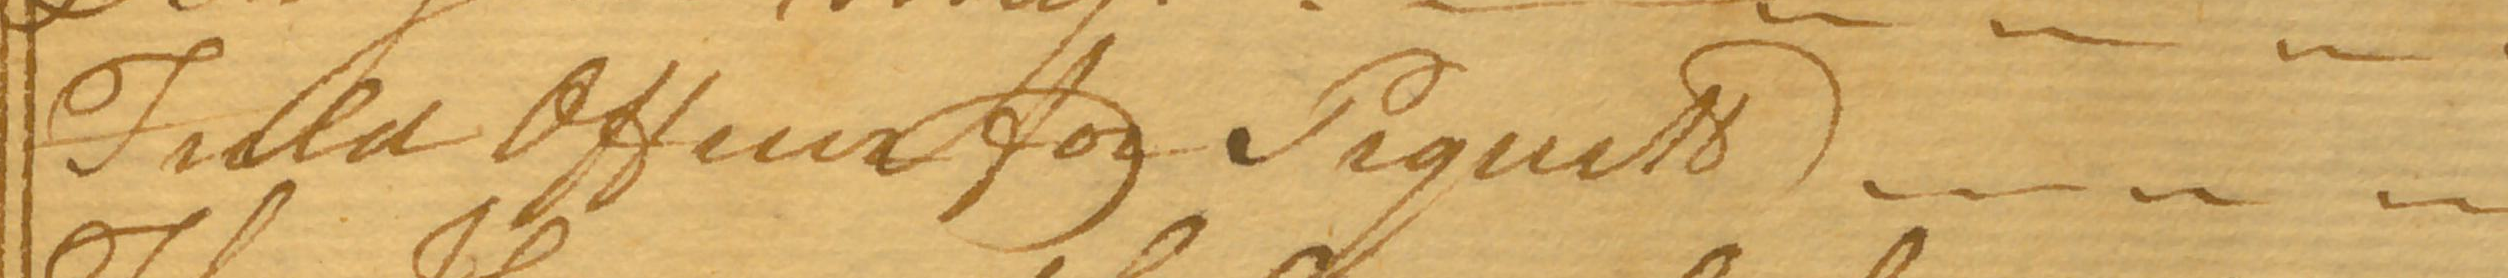Field Officer for Picquits - - -
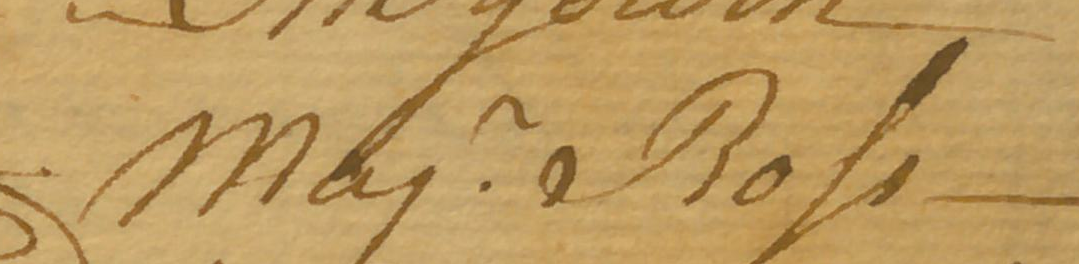Maj^r. Ross-
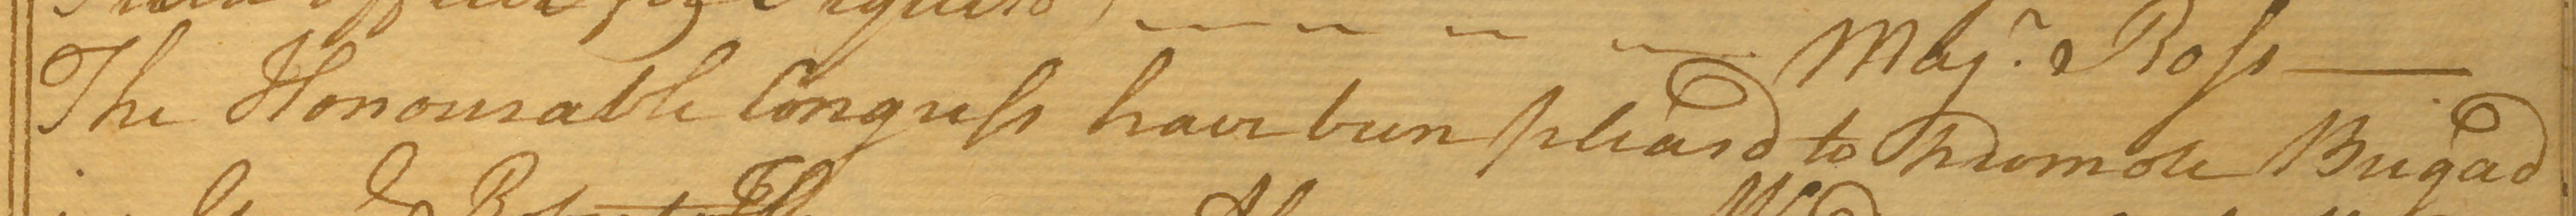The Honourable Congress have been pleasd to promote Brigad
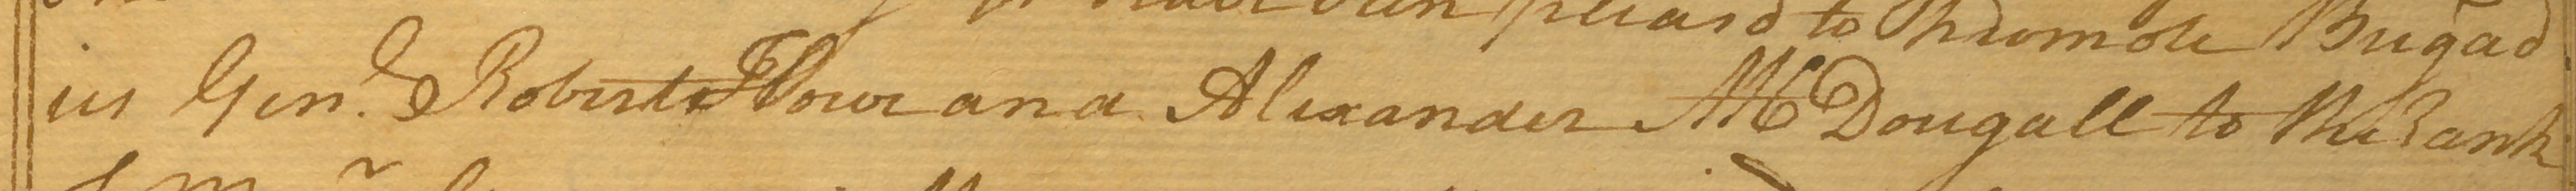ier Gen^l. Robert Flour and Alexander MCDougall to the rank
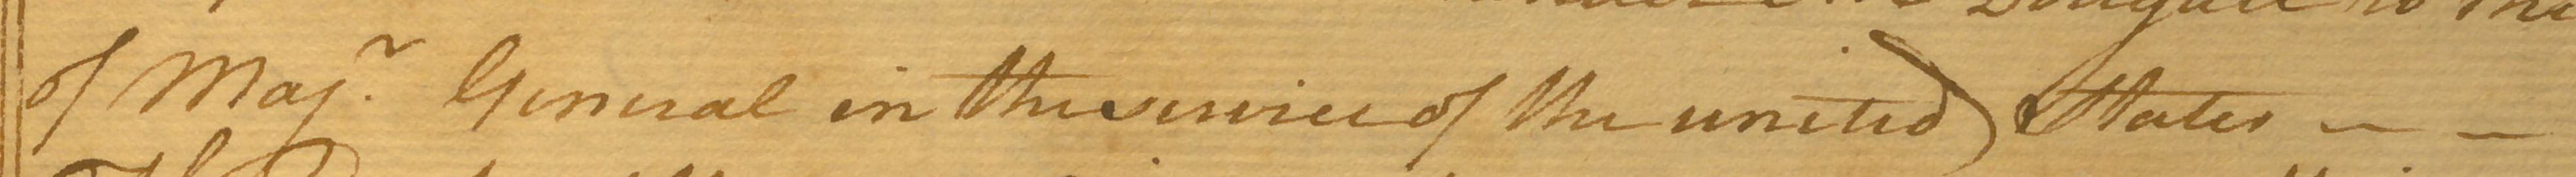of Maj^r. General in the service of the united States- -
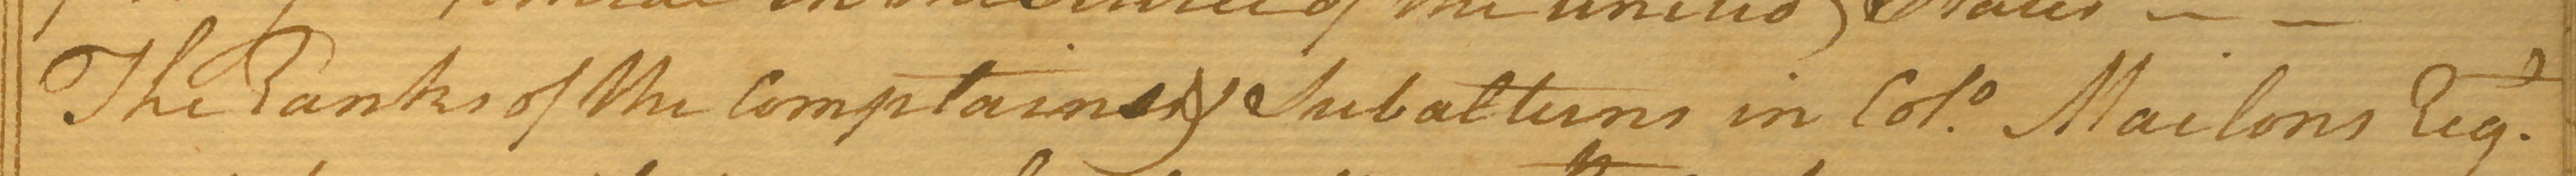The ranks of the comptains & Subalterns in Col^o. Mailons Reg^t.
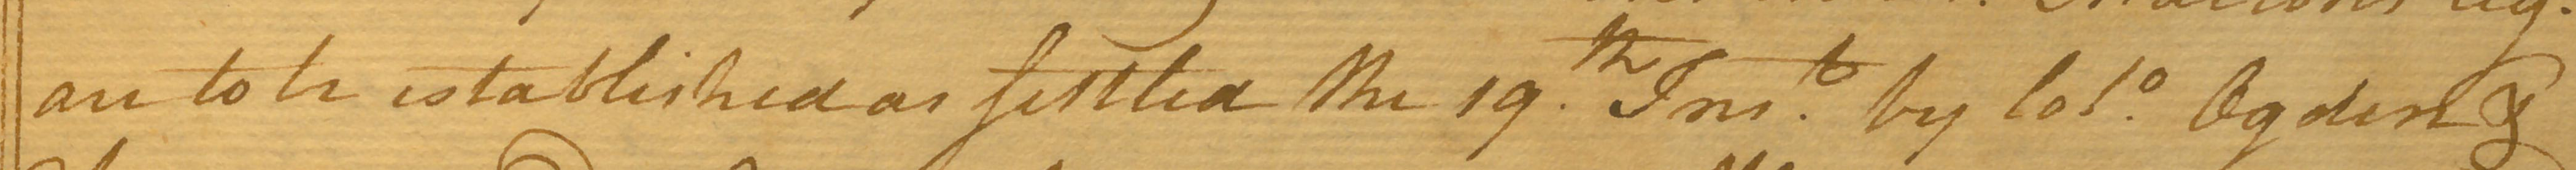are to be established as settled the 19^th. Ins^t. by Col^o. Ogden &
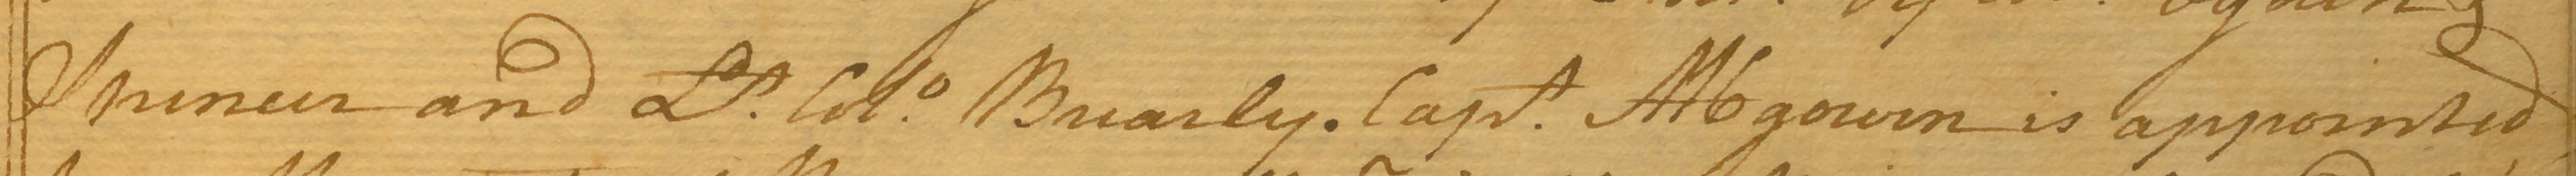Spencer and L^t. Col^o. Briarly. Cap^t. MCgowin is appointed
